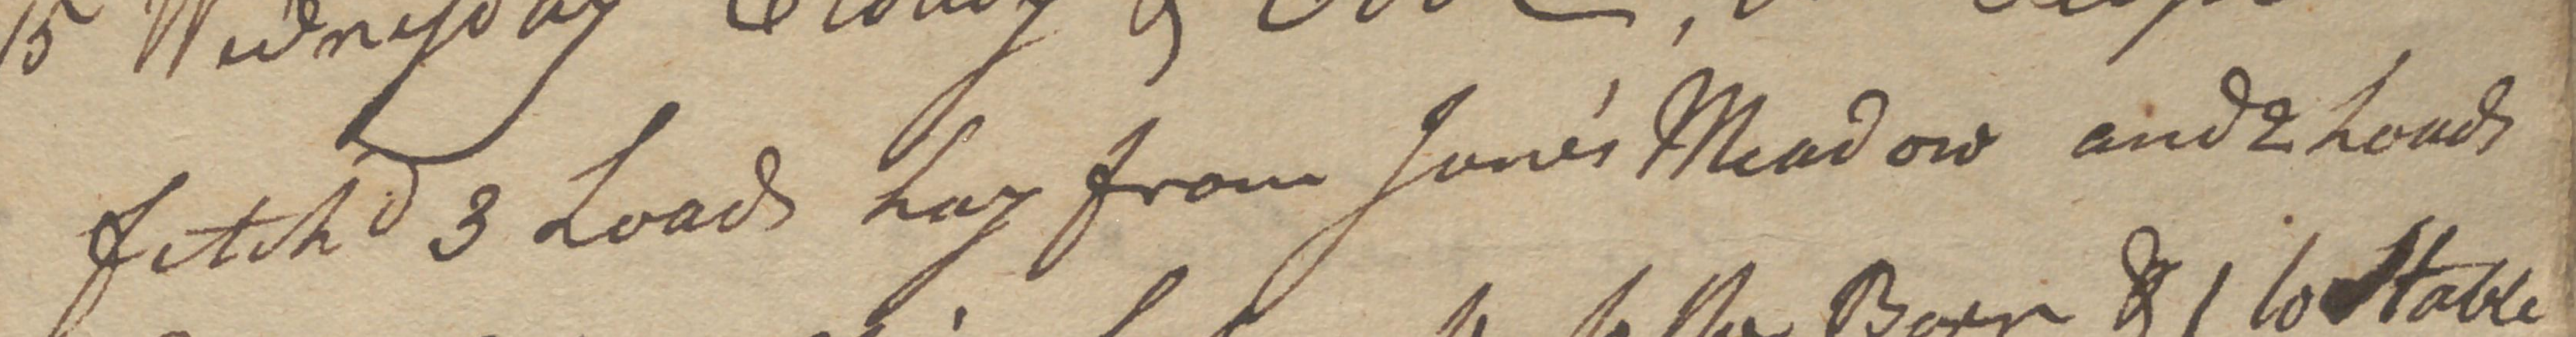fetch^d 3 Loads hay from Jones Meadow and 2 Loads
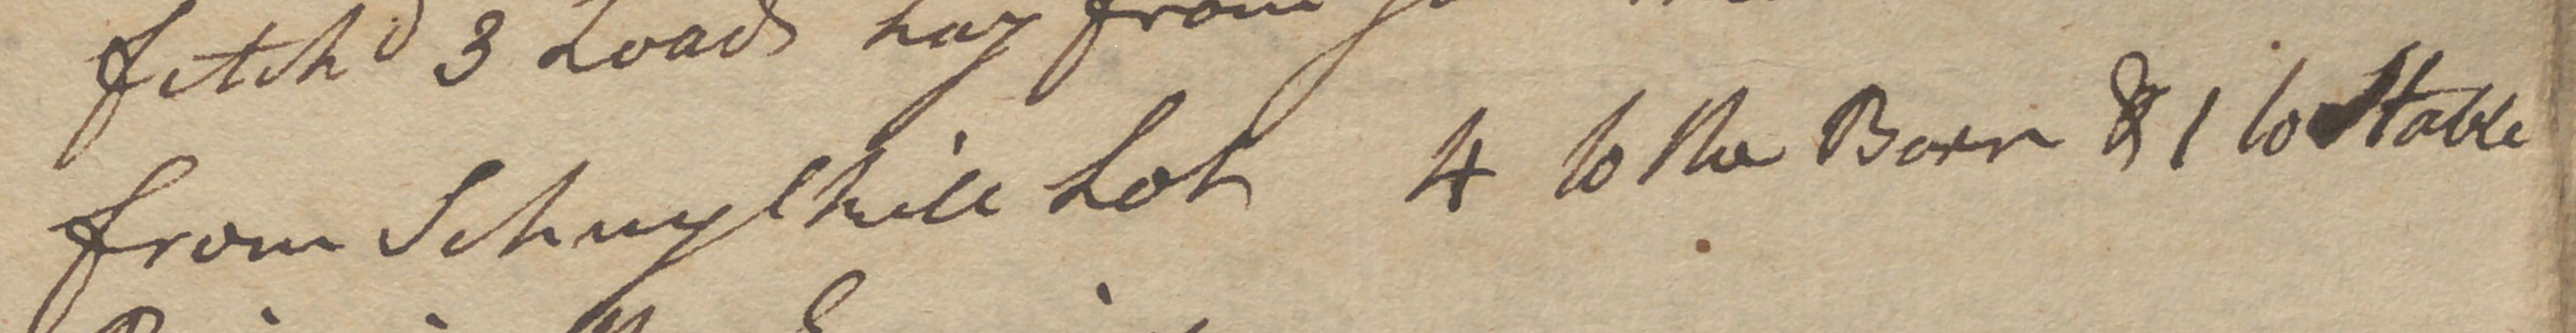from Schuylkill Lot 4 to the Barn & 1 to Stable
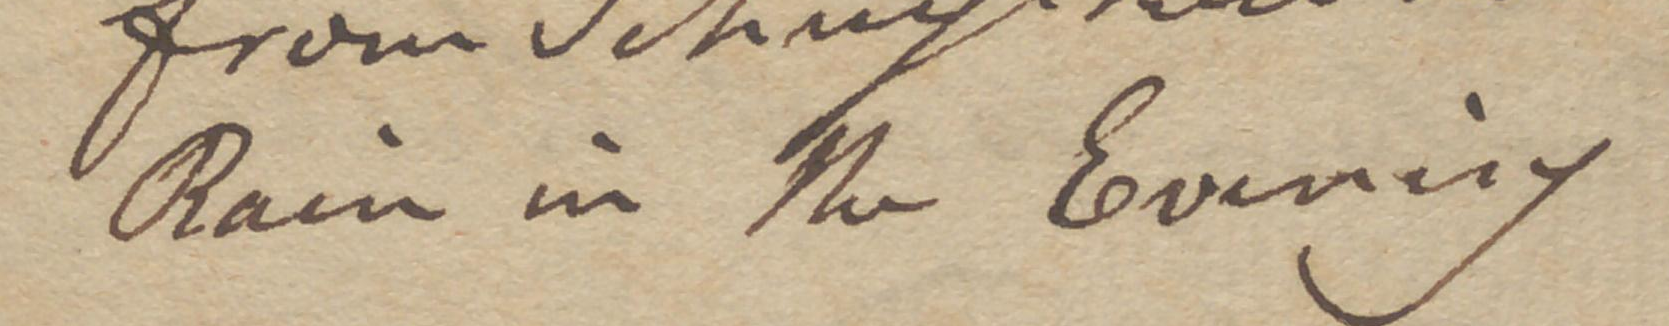Rain in the Evening
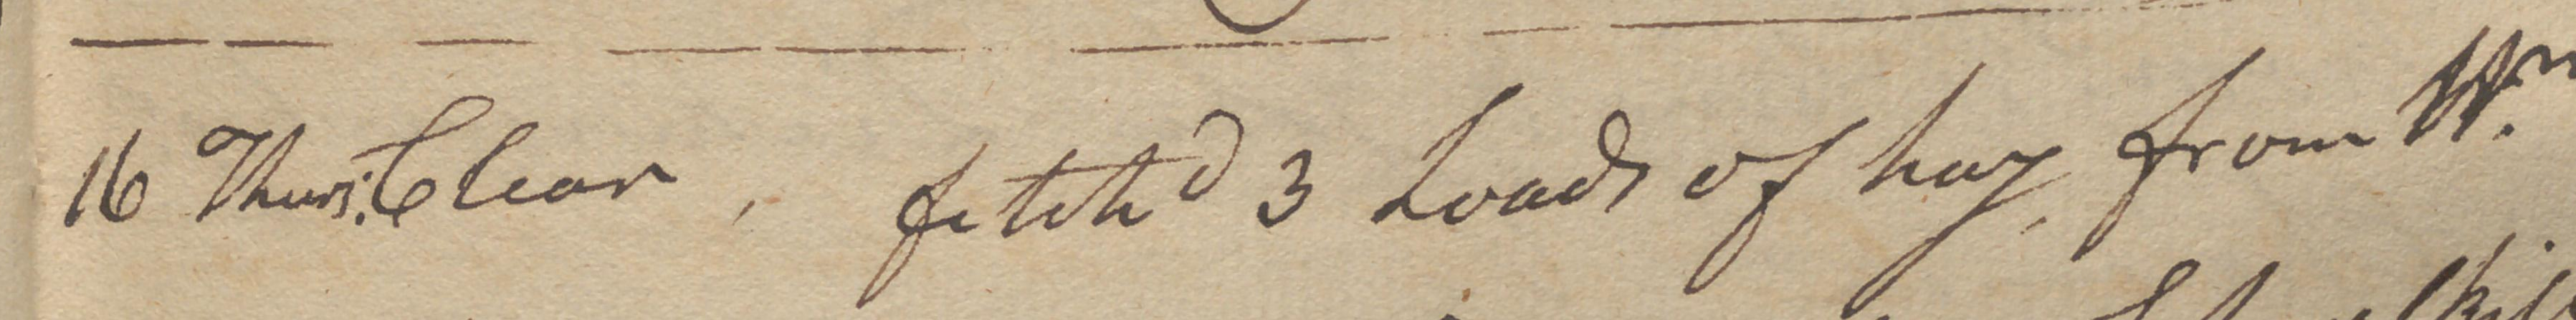16 Thurs: Clear, fetch^d 3 Loads of hay, from W^m.
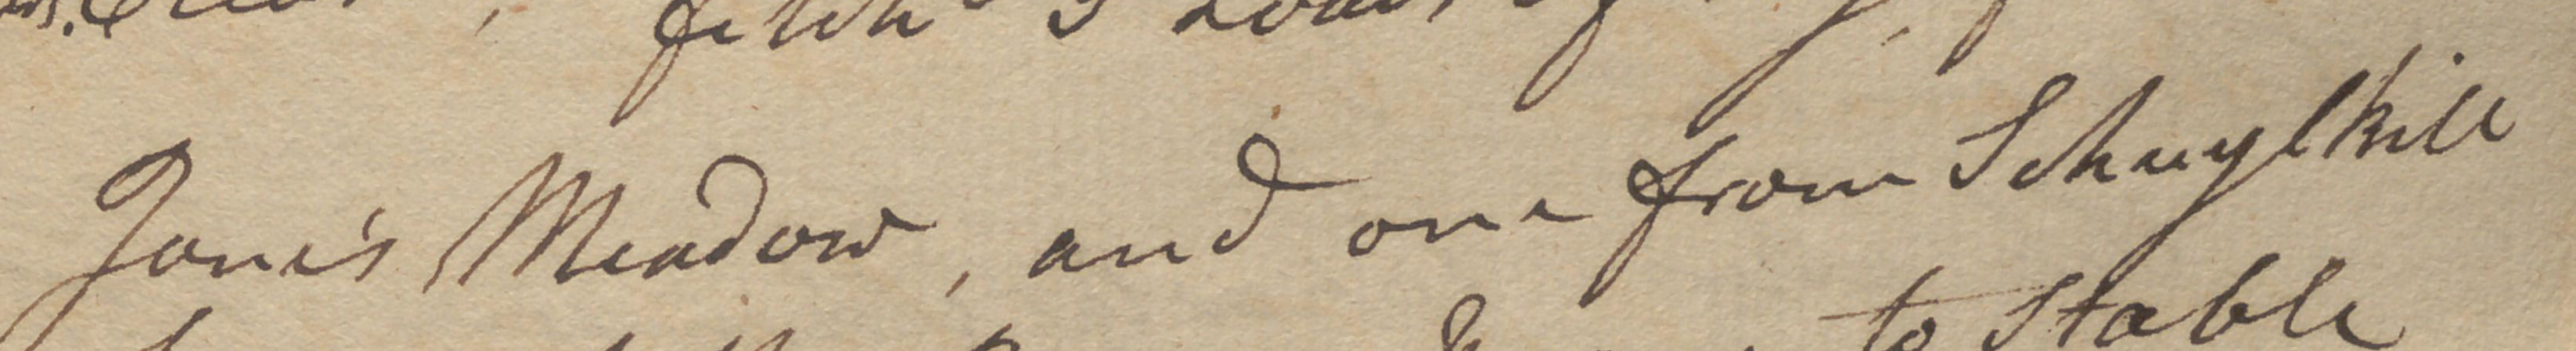Jone's Meadow, and one from Schuylkill
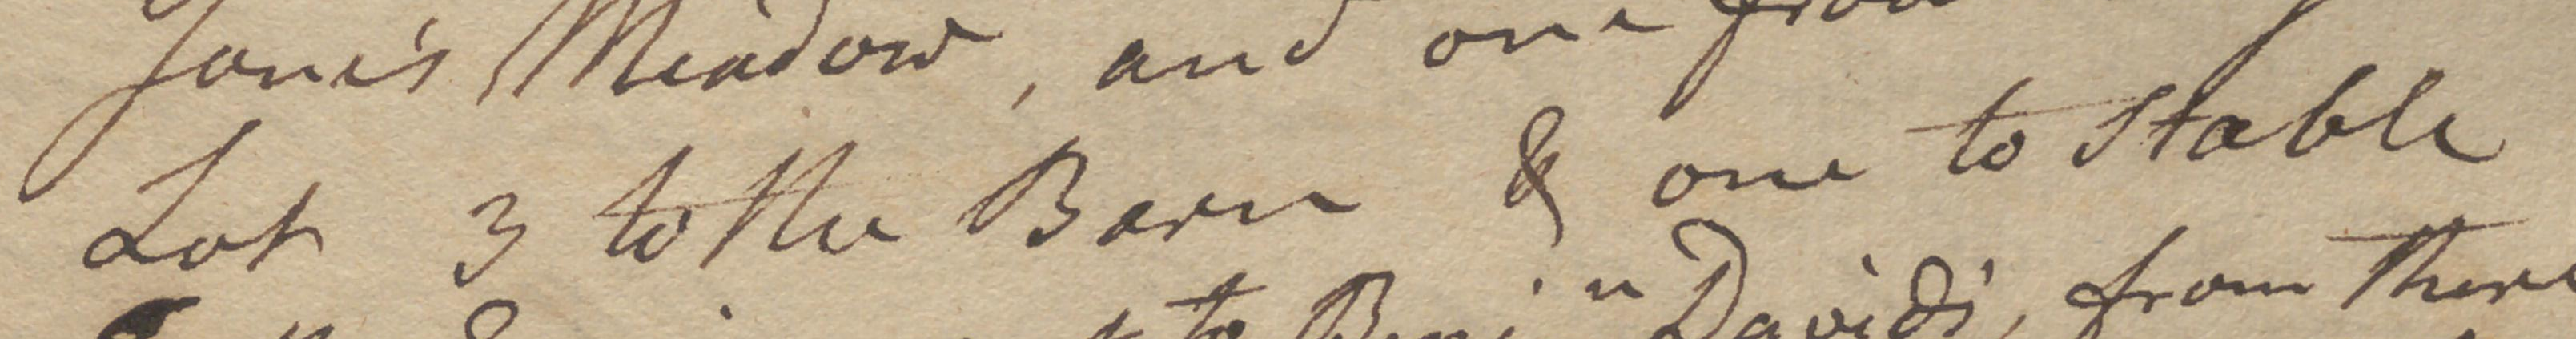Lot 3 to the Barn & one to stable
